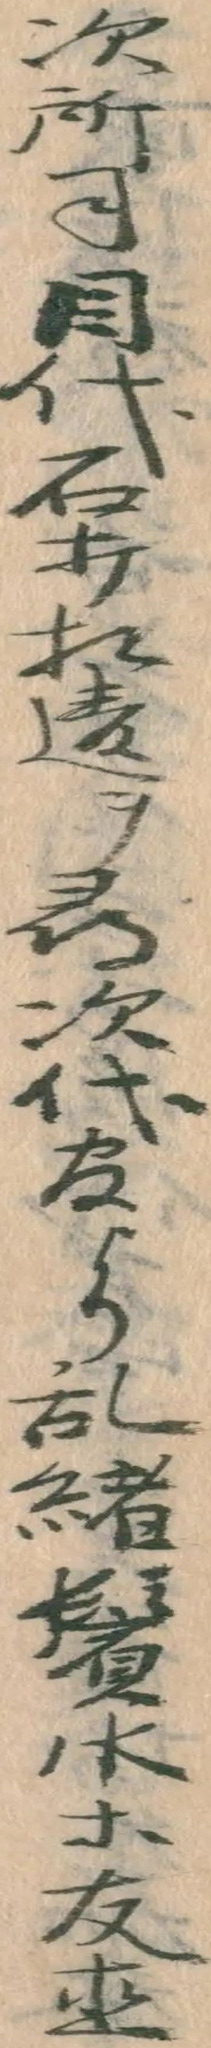次所司目代石打相違ヲ尋次代官より乱緒鬢水等友直
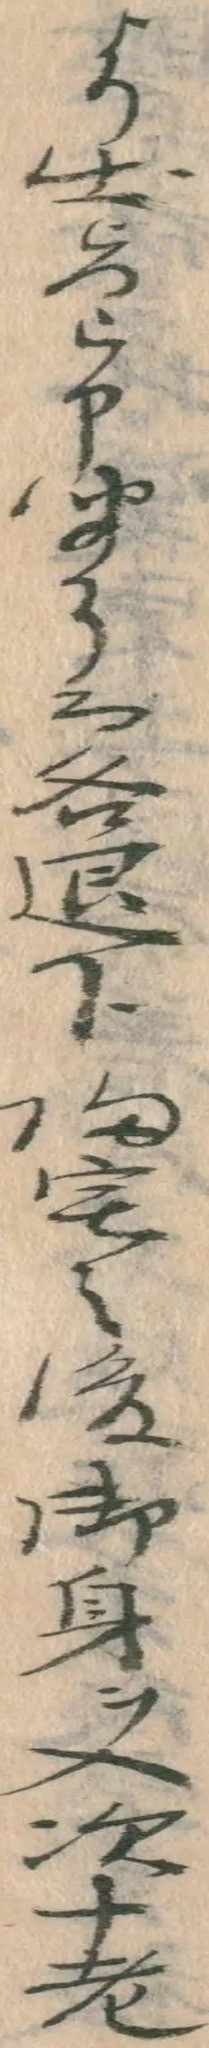より出旨被申聞候而各退下帰宅之後御身ヲ入次十老
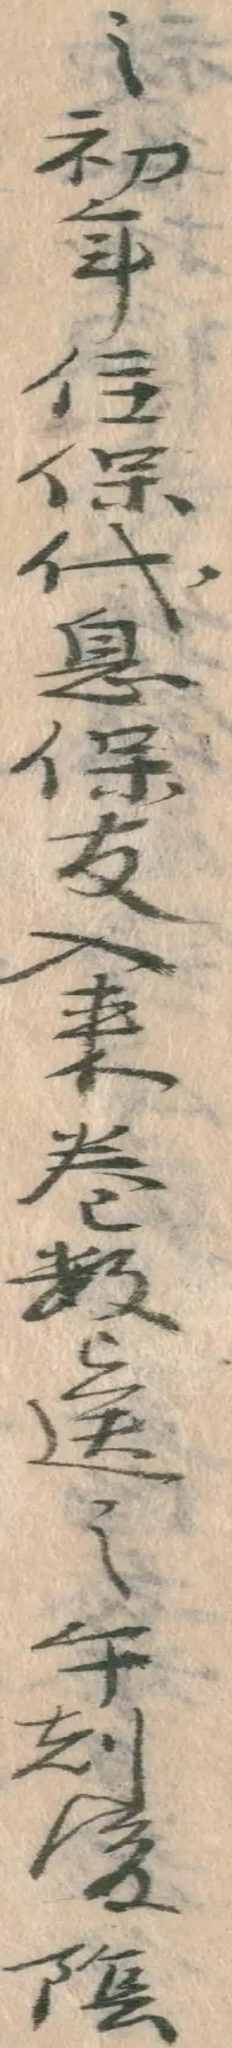之初年住保代息保友入来巻数被送之午刻後陰
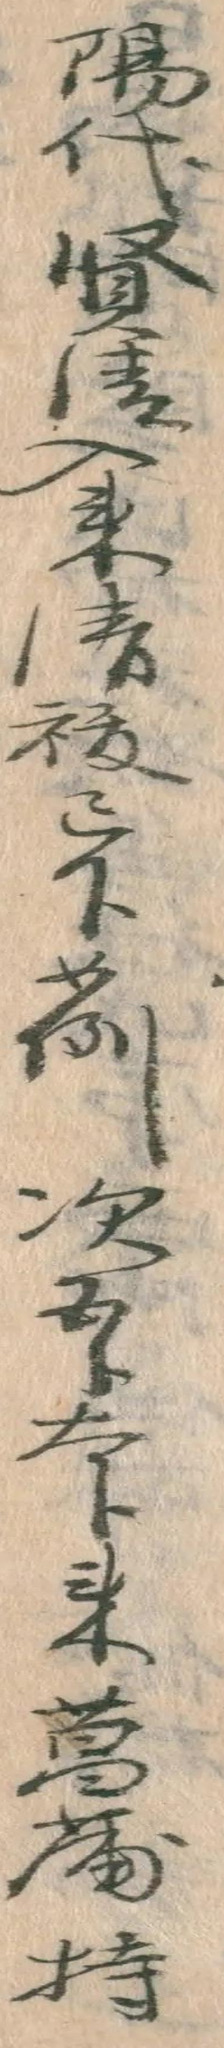陽代賢清入来清祓已下如例次五郎太郎来菖蒲特
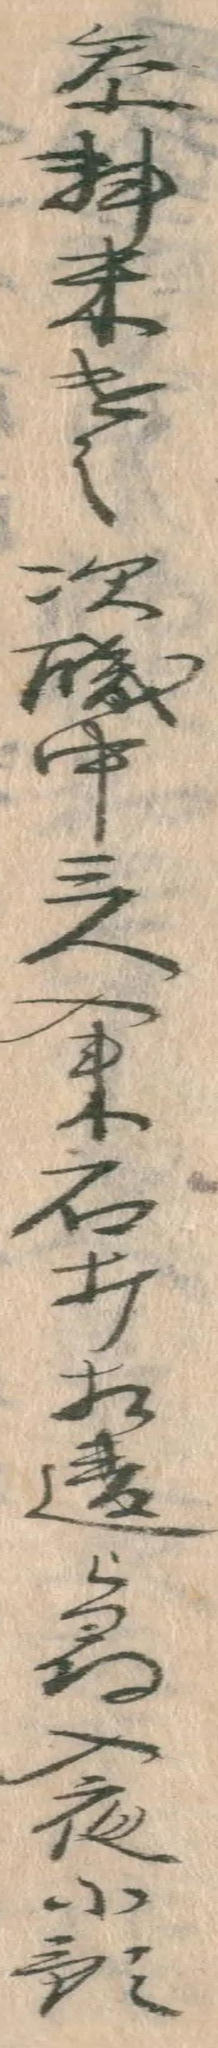参料来遣之次職中三人入来石打相違被尋入夜小預
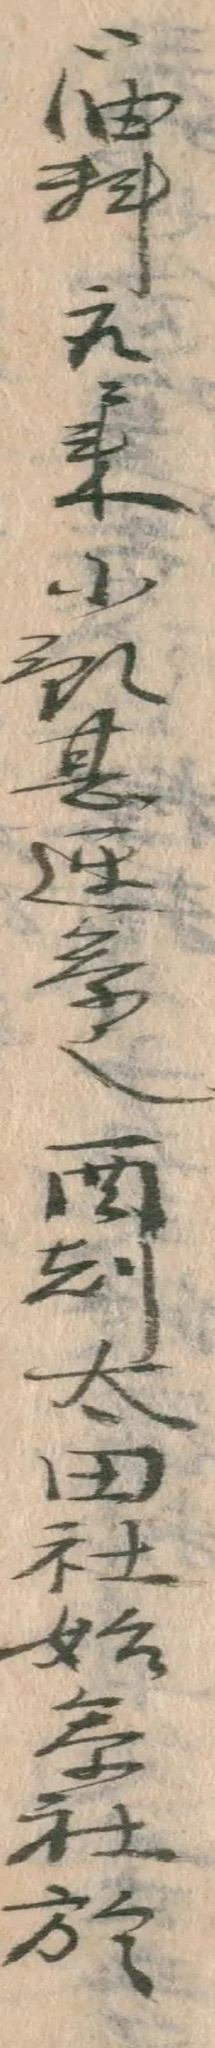御油料取ニ来小預甚遅参也酉刻太田社始参社於
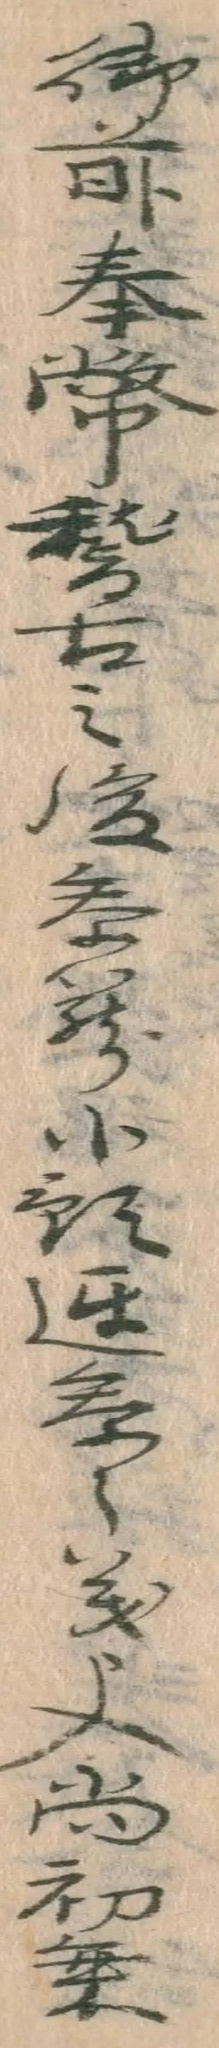御前奉幣稽古之後参籠小預遅参之義申入尚初乗
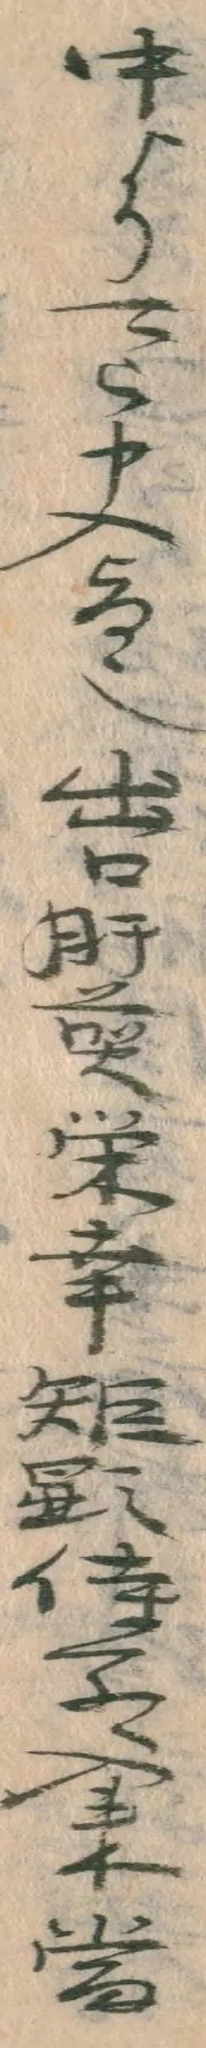中より可被申入旨也出口肝煎栄幸矩顕侍所へ入来當
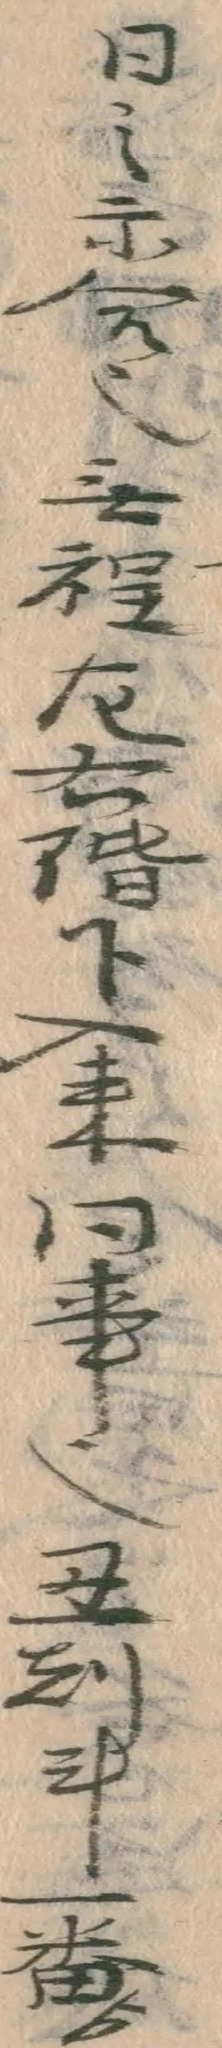日之示合也無程左右階下入来同事也丑刻斗一番ゟ
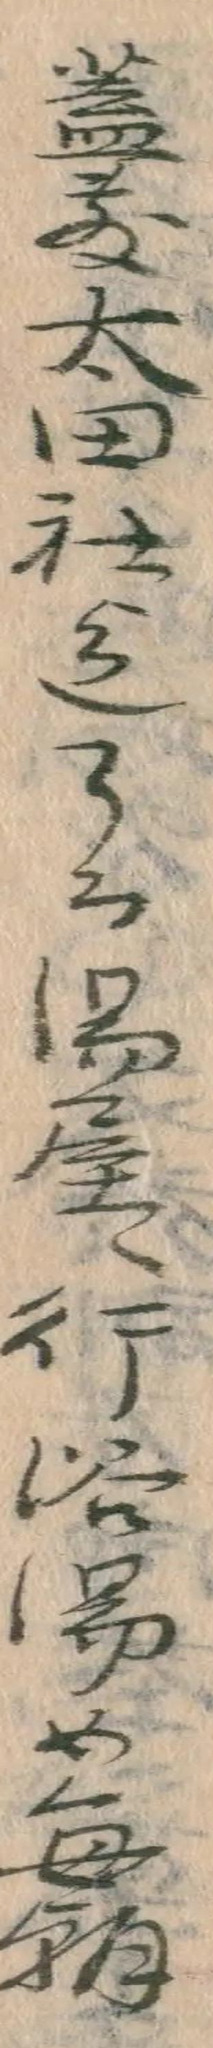蓋敷太田社迄了而湯屋へ行浴湯如毎朝
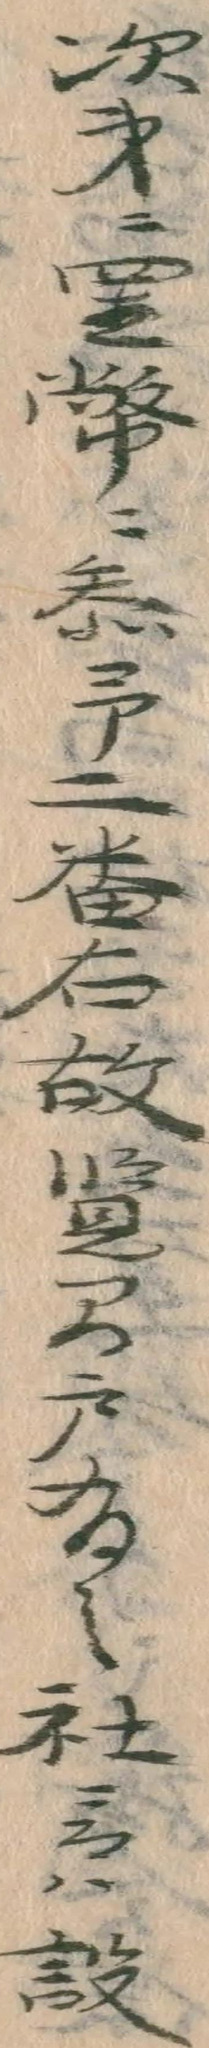次第二置幣ニ参予二番右故覧間戸有之社ニ而ハ設
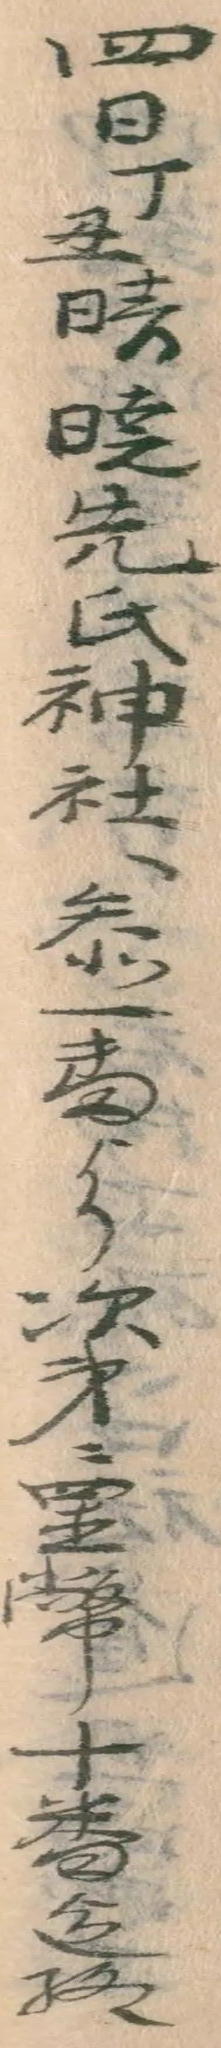四日丁丑晴暁先氏神社へ参一番より次第に置幣十番迄終
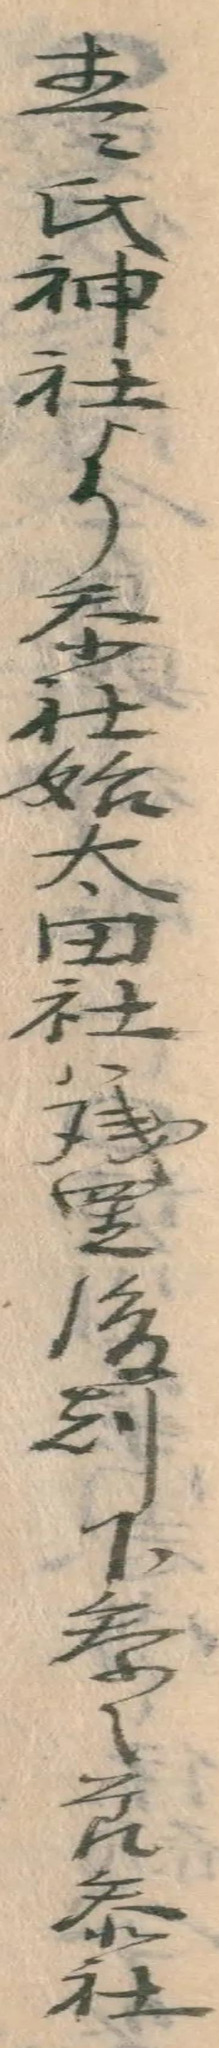直ニ氏神社より参社始太田社ハ残置後刻下参之節参社
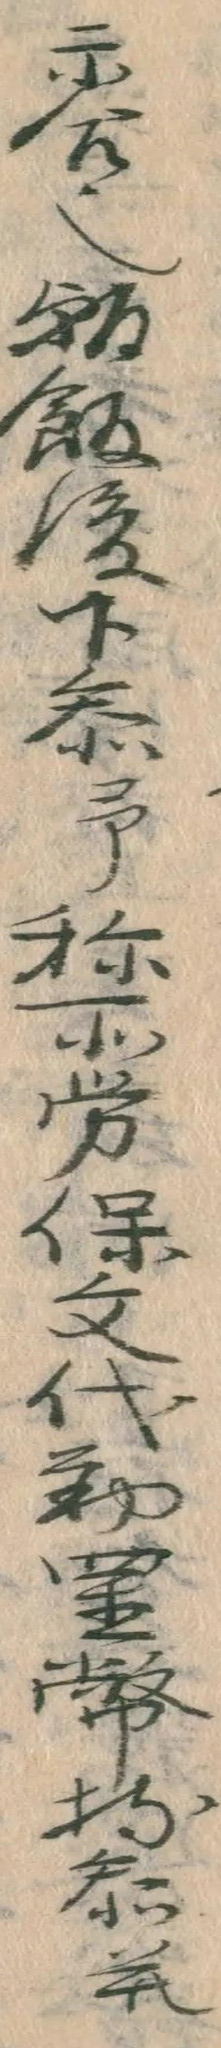示合也朝飯後下参予称所労保文代勤置幣持参幷
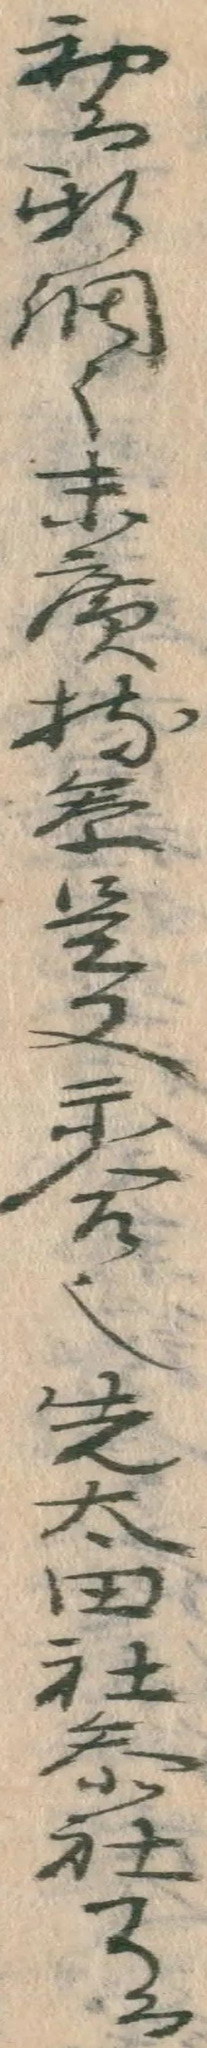初而新調之末廣持参是又示合也先太田社参社了而
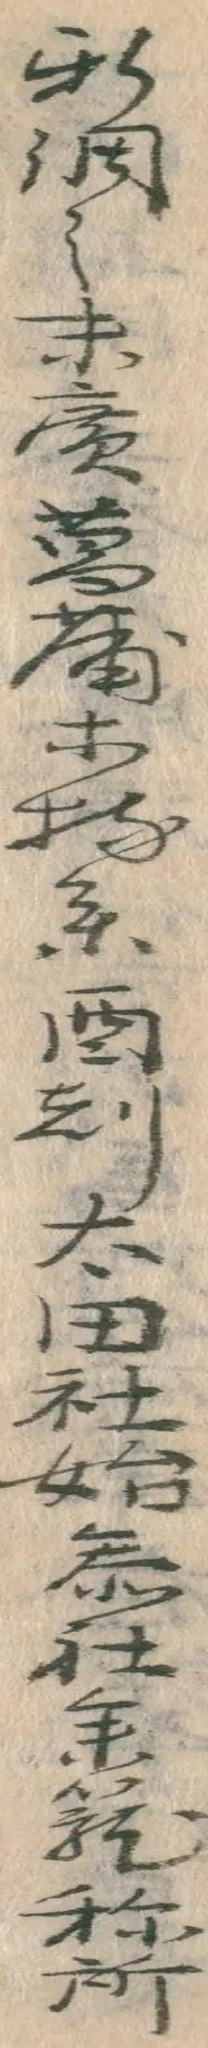新調之末廣菖蒲等持参酉刻太田社始参社参籠称所
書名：賀茂社記録. 第63冊
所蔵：国立国会図書館 National Diet Library, JAPAN
